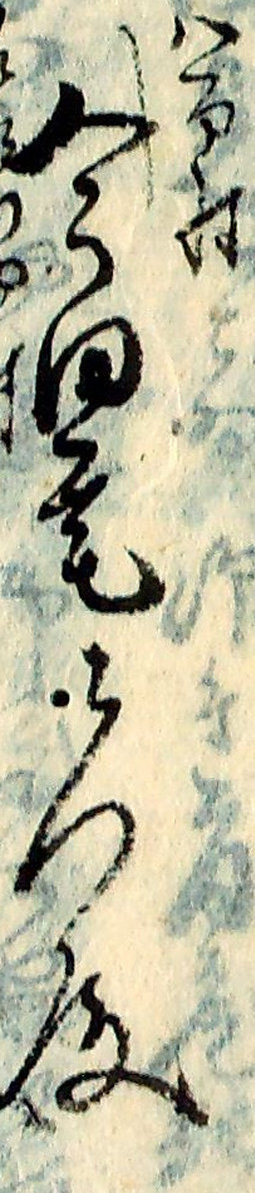今田宅右衛門殿
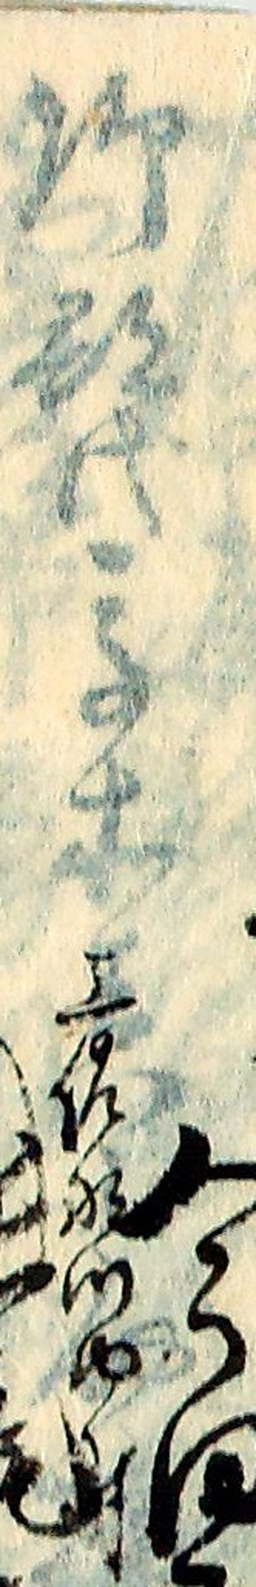上佐那川内村
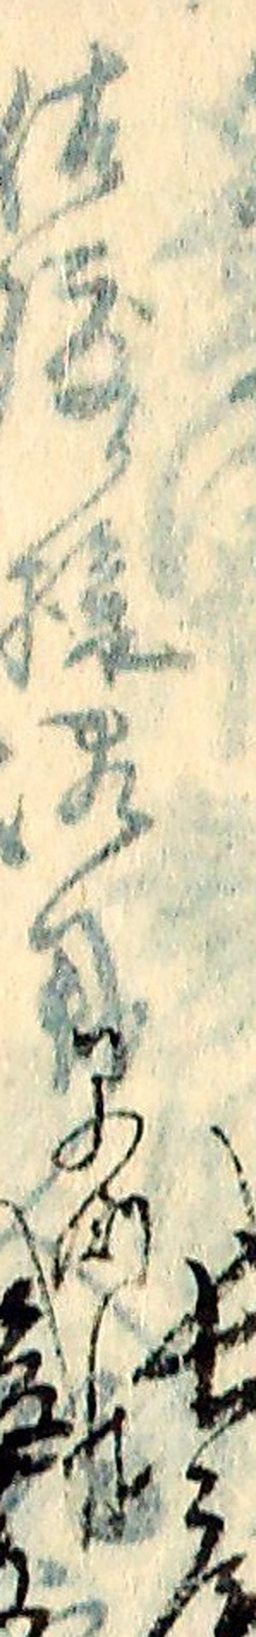早淵村
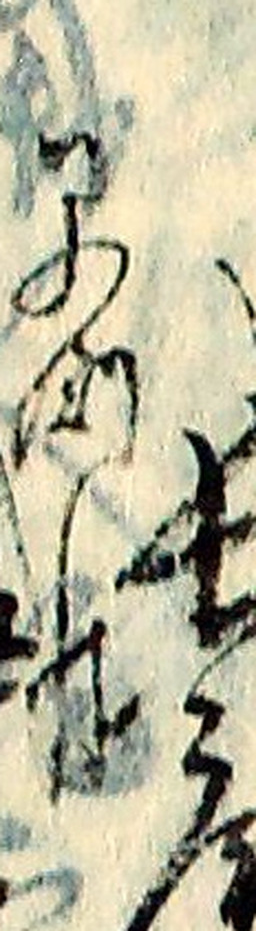早淵村
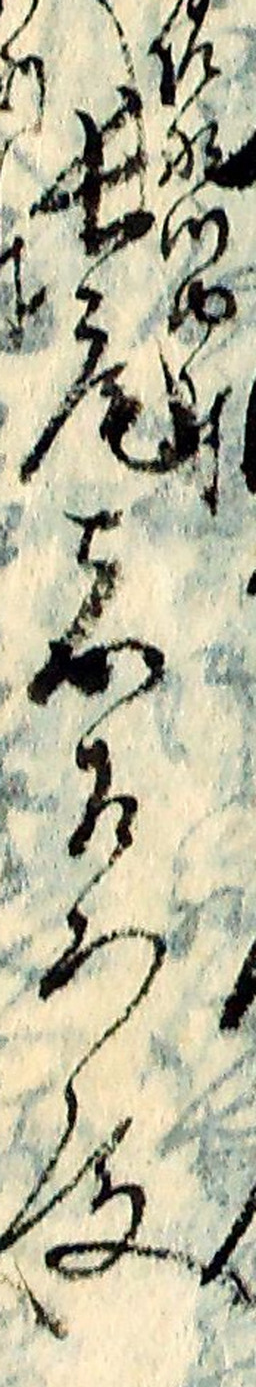長尾嘉左衛門殿
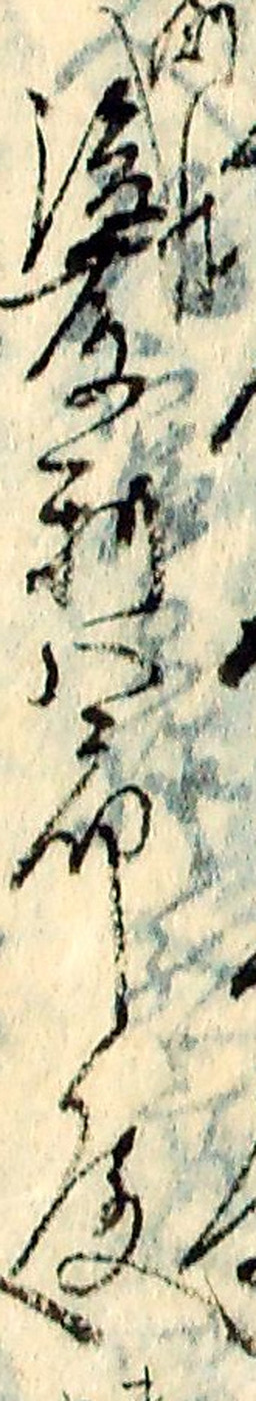後藤利八郎殿
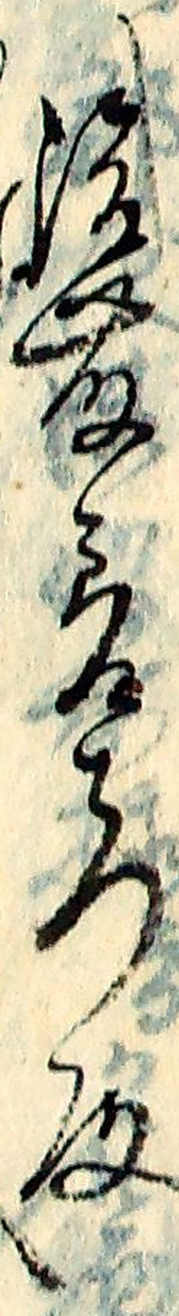後藤善右衛門殿
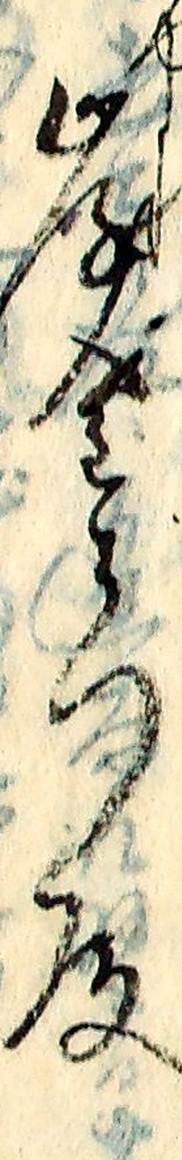岸金右衛門殿

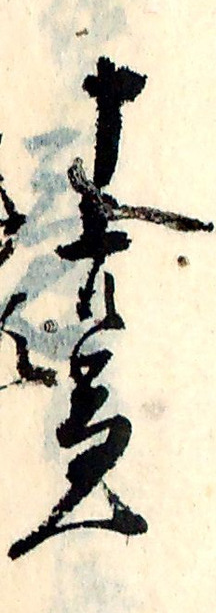申上る覚
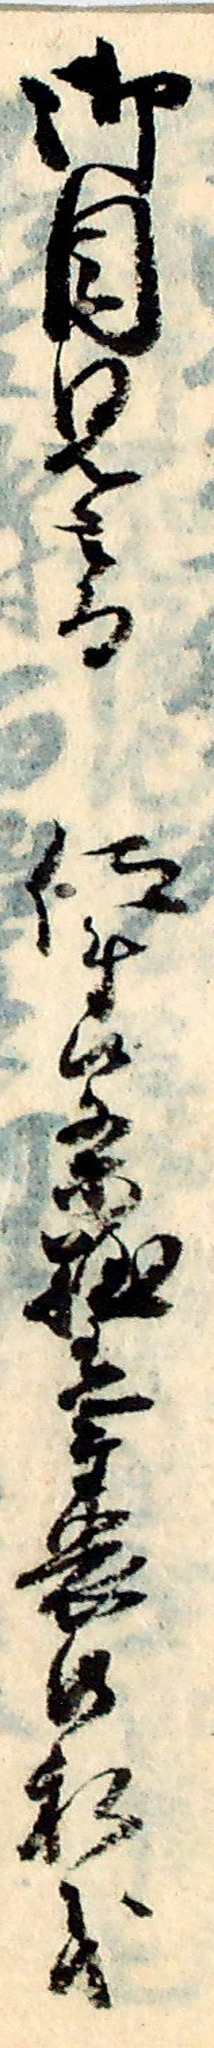御目見被為仰付候条難有奉畏候私義
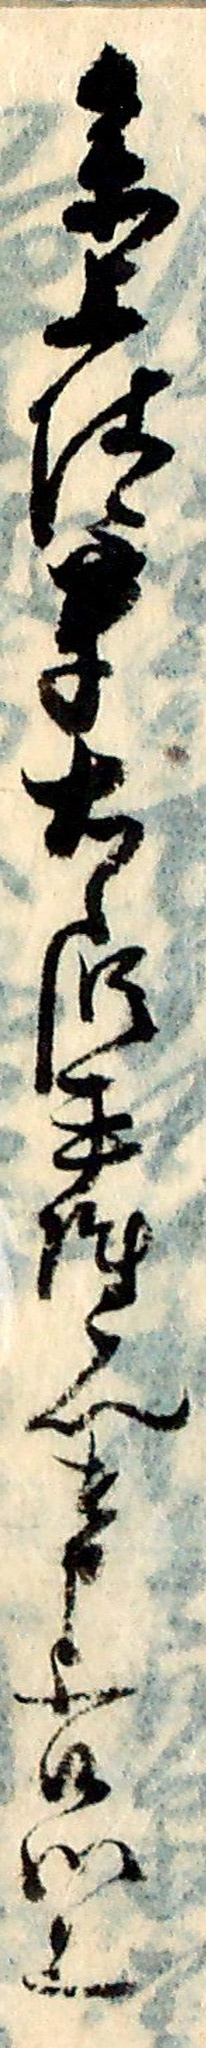参上仕候付右之段書附を以奉申上候以上
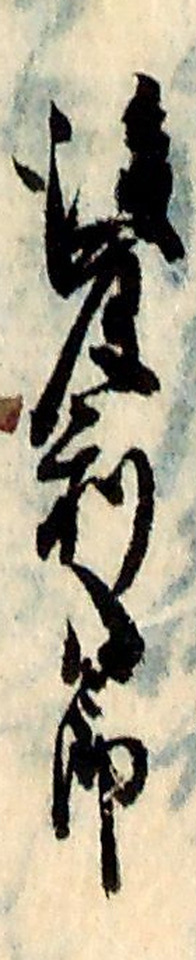後藤利八郎
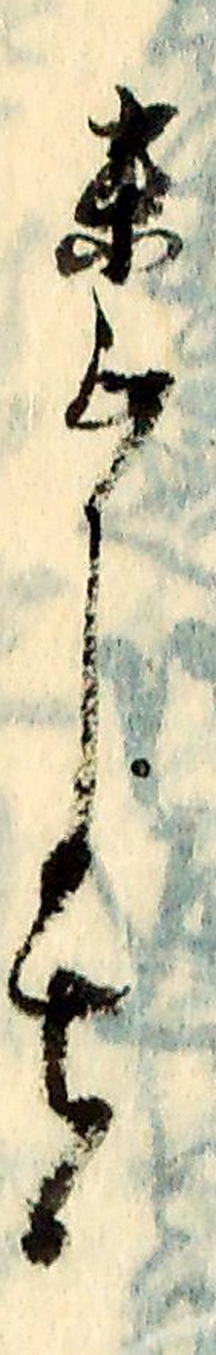未正月七日
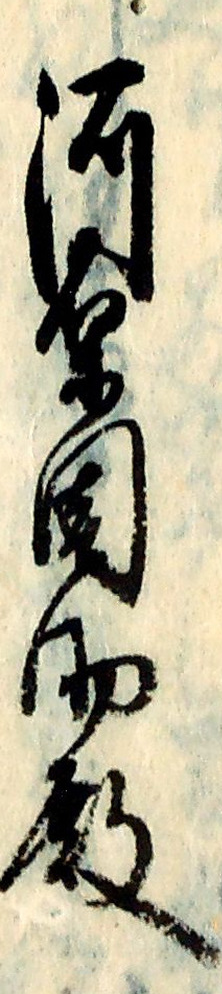河原周助殿
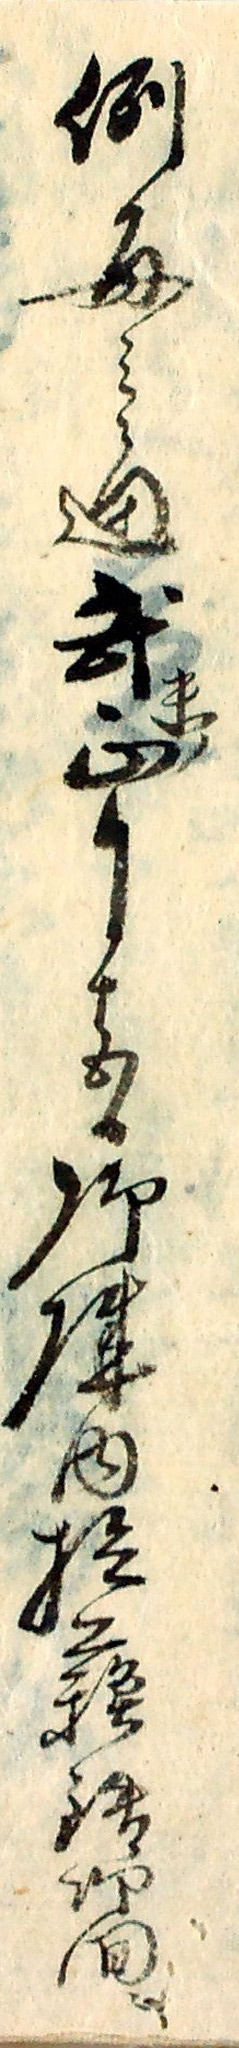例毎之通当未ノ正月十五日御城内於蘇鉄御間
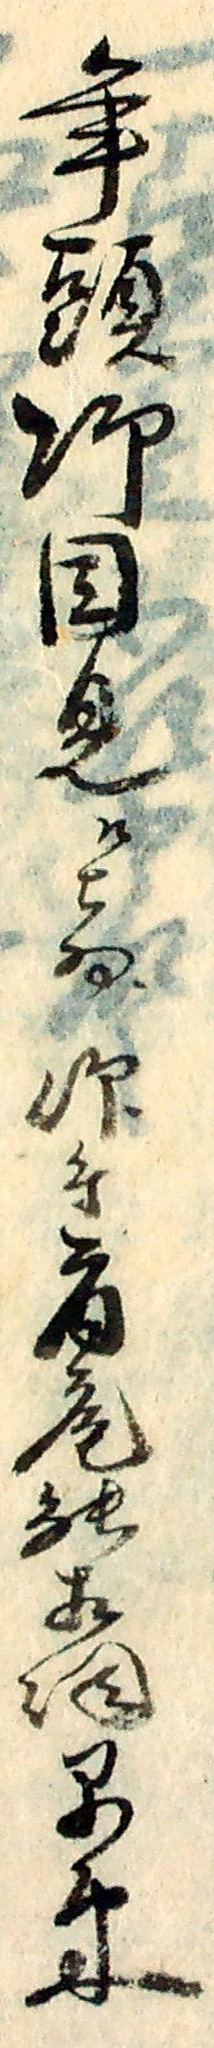年頭御目見え被為仰付首尾能相調早束
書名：諸御願書控(後藤氏壱番）
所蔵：鳴門教育大学 Naruto University of Education
